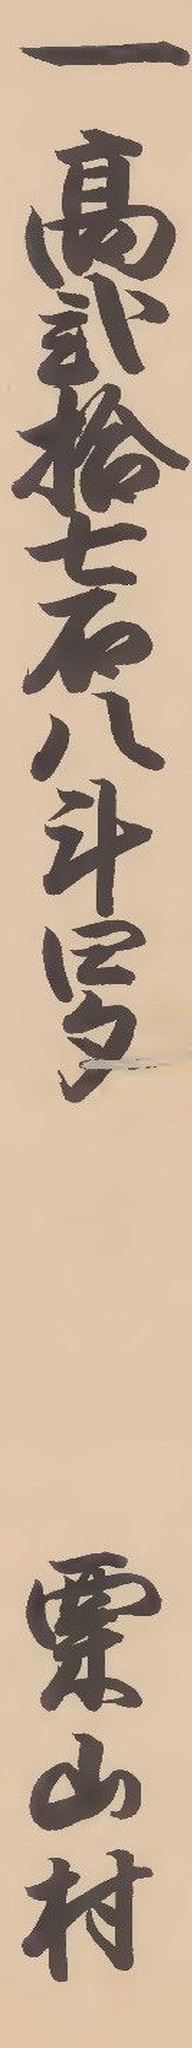一髙弐拾七石八斗四夕栗山村
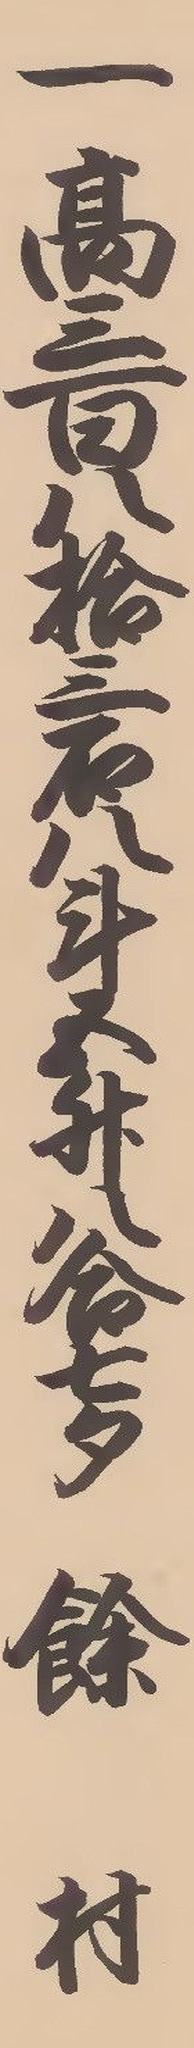一髙三百八拾三石八斗五升八合七夕餘村
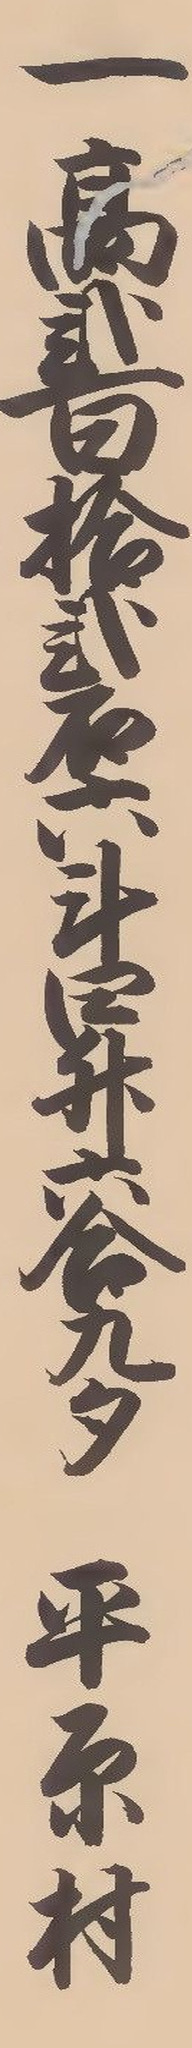一髙弐百拾弐石六斗四升六合九夕平原村
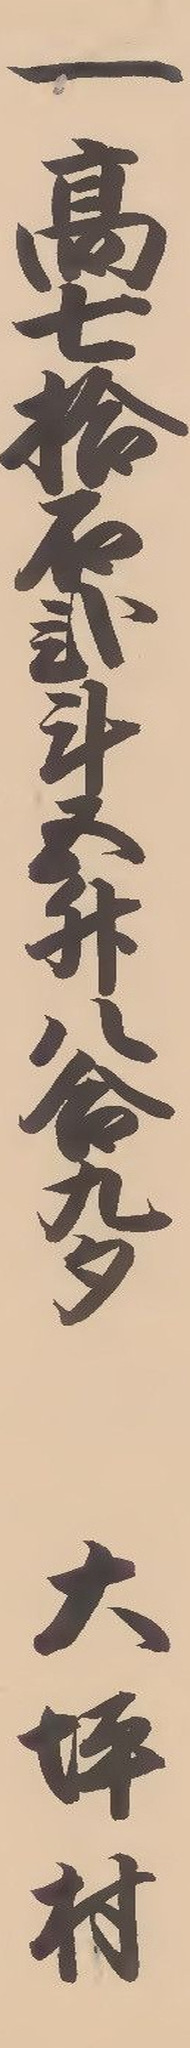一髙七拾石弐斗五升八合九夕大坪村
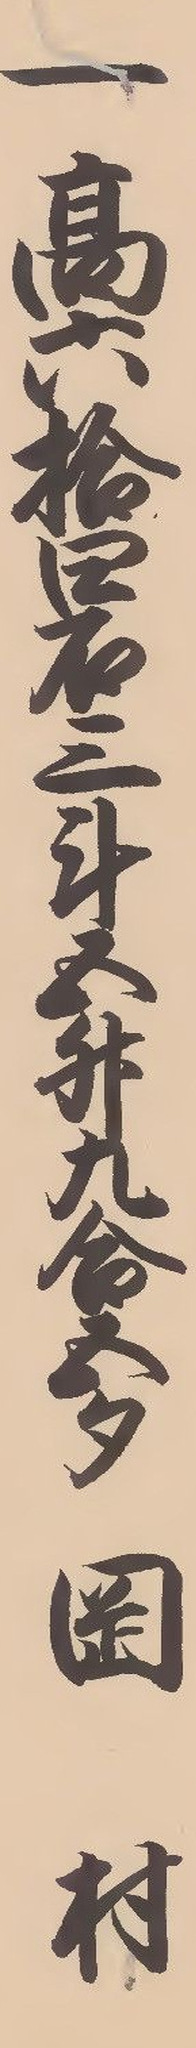一髙六拾四石三斗五升九合五夕岡村
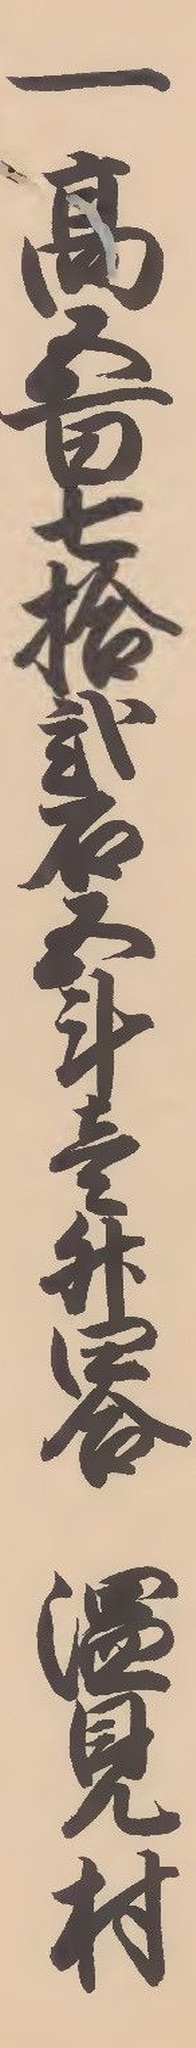一髙五百七拾弐石五斗壱升四合温見村
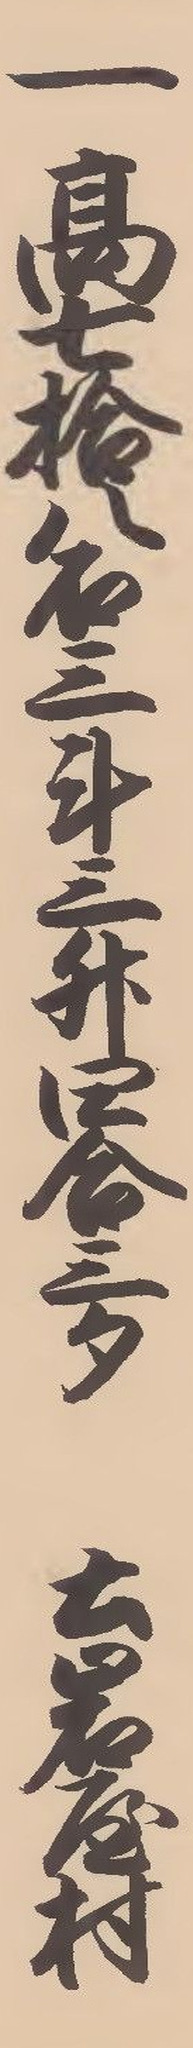一髙七拾八石三斗三升四合三夕土岩屋村
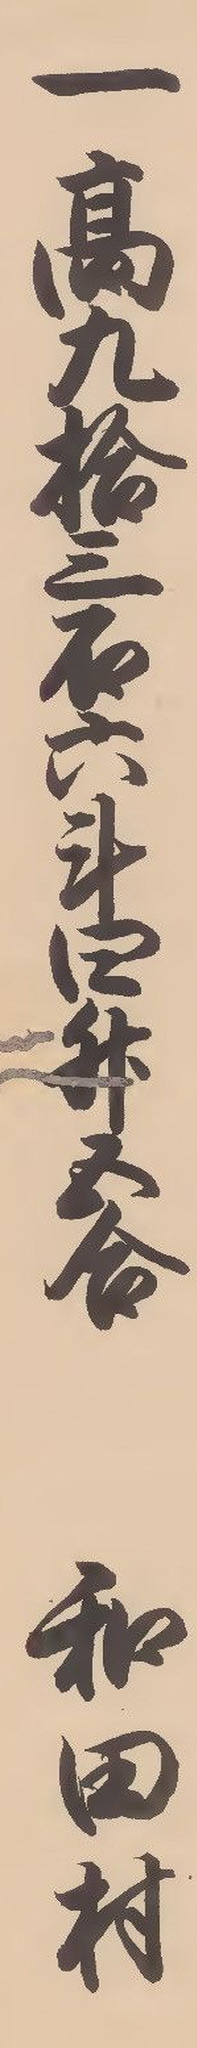一高九拾三石六斗四升五合和田村

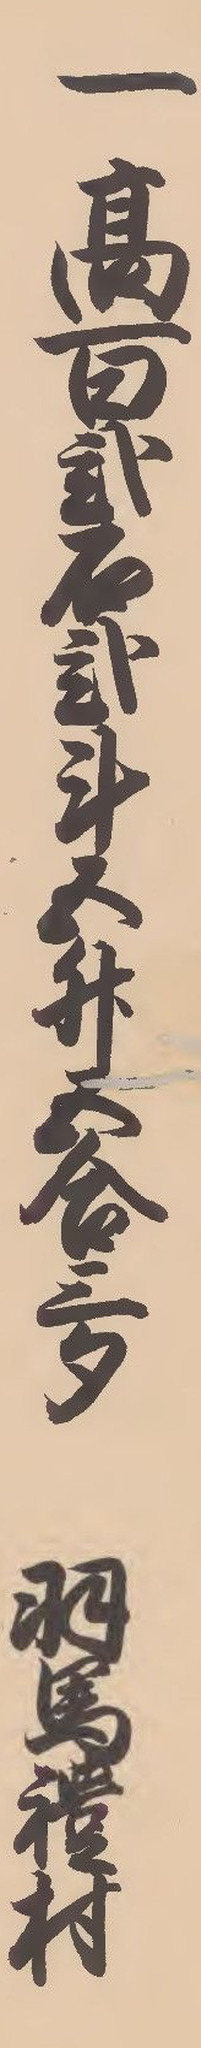一髙百弐石弐斗五升五合三夕羽馬禮村
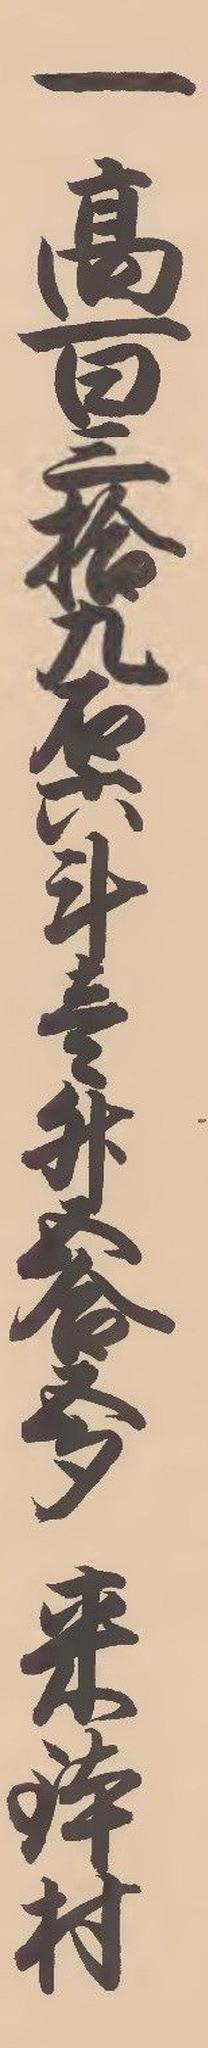一髙百三拾九石六斗壱升五合五夕来鉢村
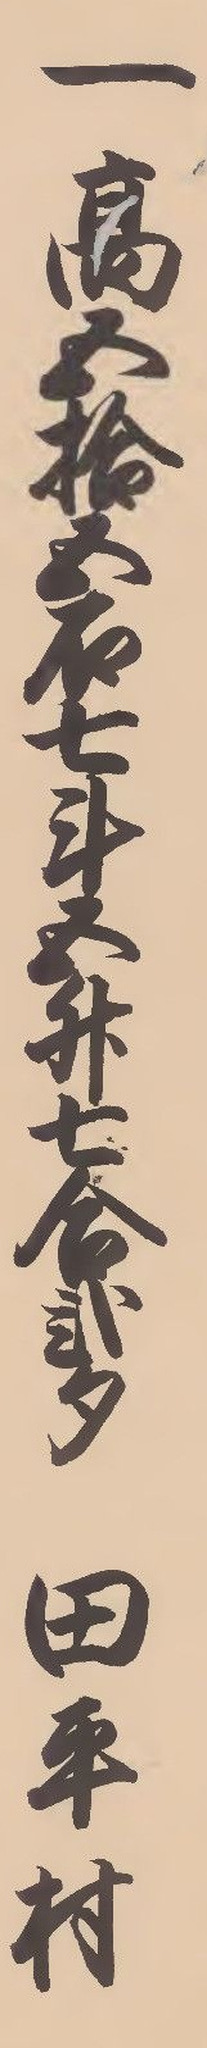一髙五拾五石七斗五升七合弐夕田平村
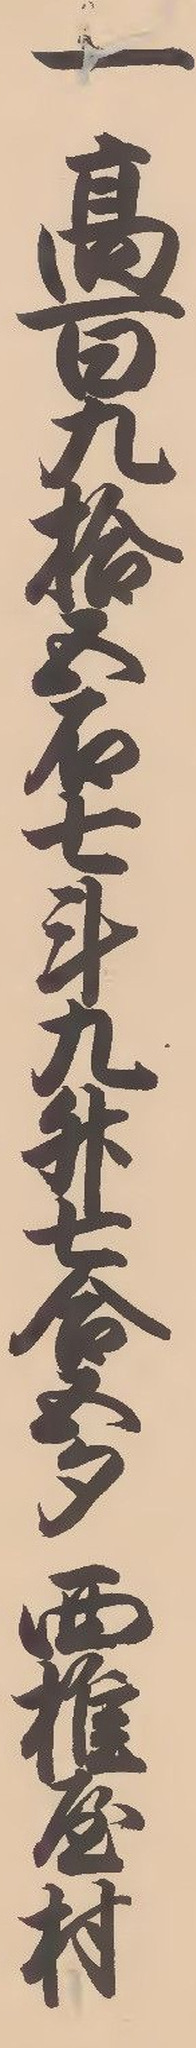一髙百九拾五石七斗九升七合五夕西椎屋村
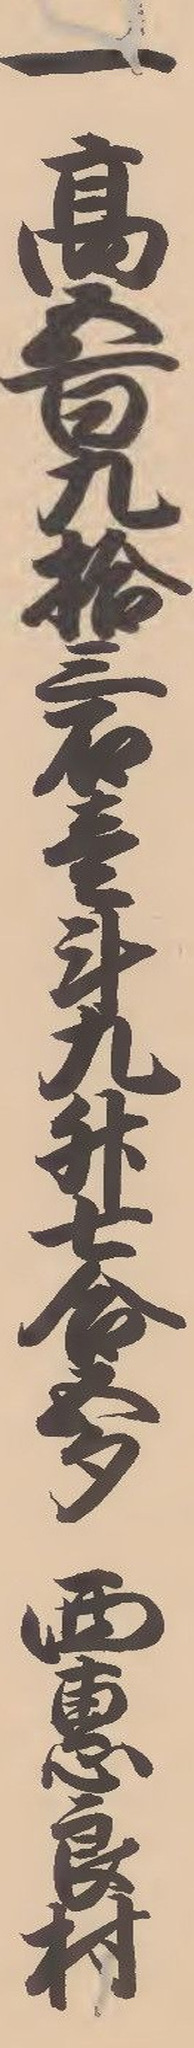一髙五百九拾三石壱斗九升七合五夕西恵良村
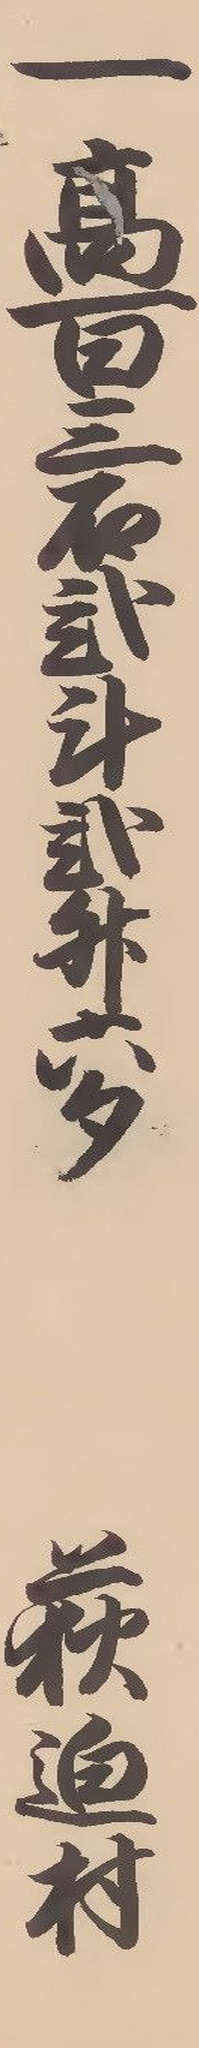一髙百三石弐斗弐升六夕萩迫村
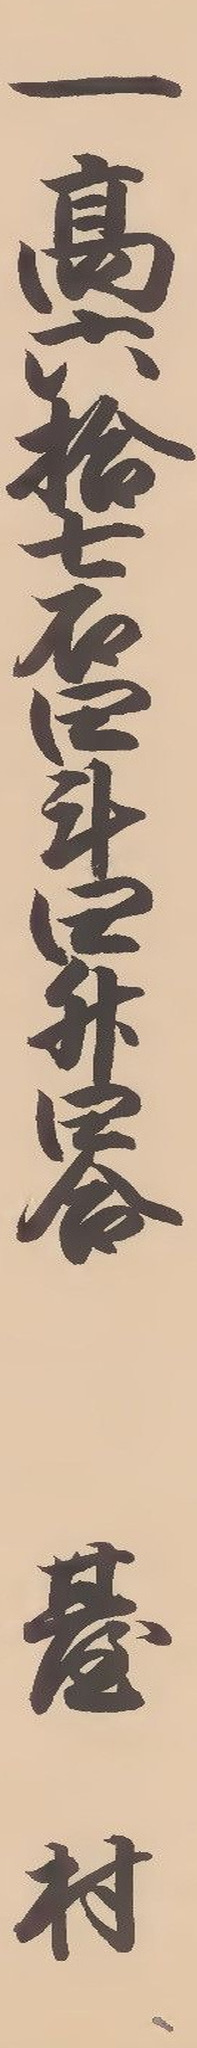一髙六拾七石四斗四升四合䑓村
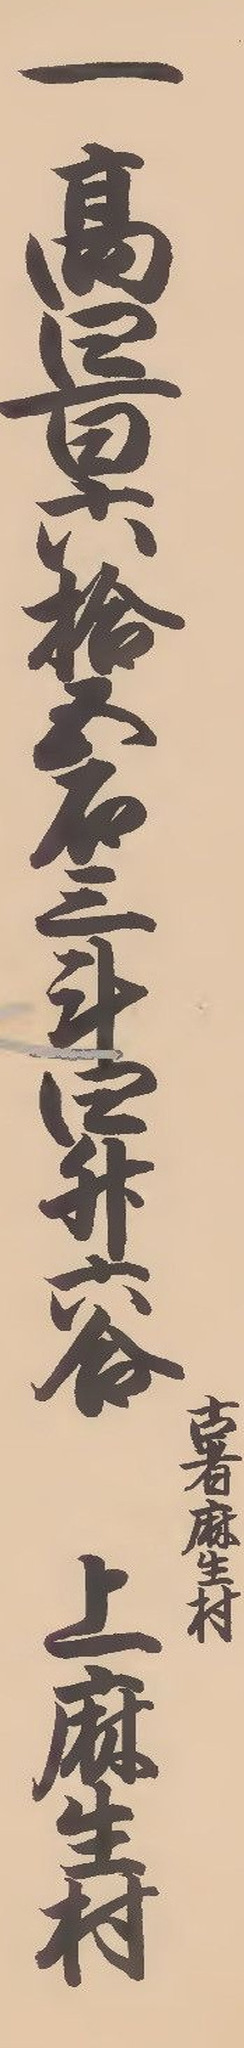一髙四百六拾五石三斗四升六合上麻生村
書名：豊前国郷帳
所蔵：国立公文書館 National Archives of Japan
